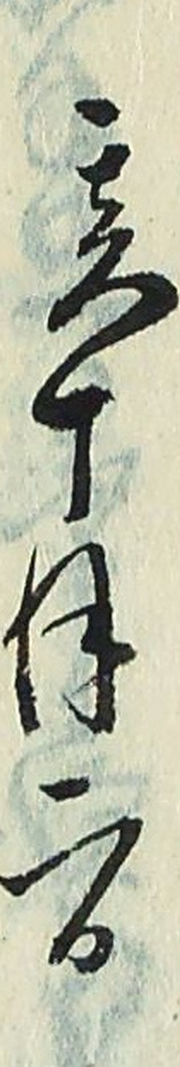亥十月二日
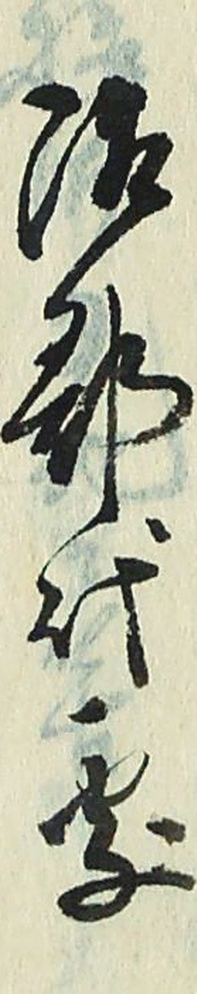御郡代處
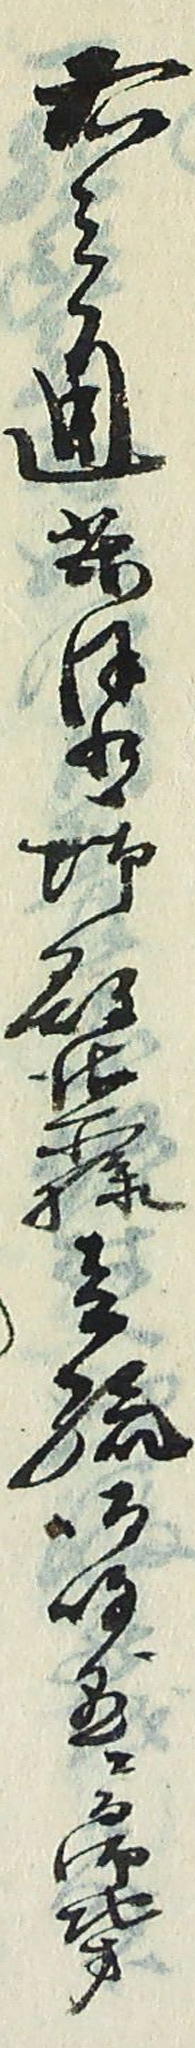右之通當月九日御郡代所様壱統御呼懸ニ而御地方
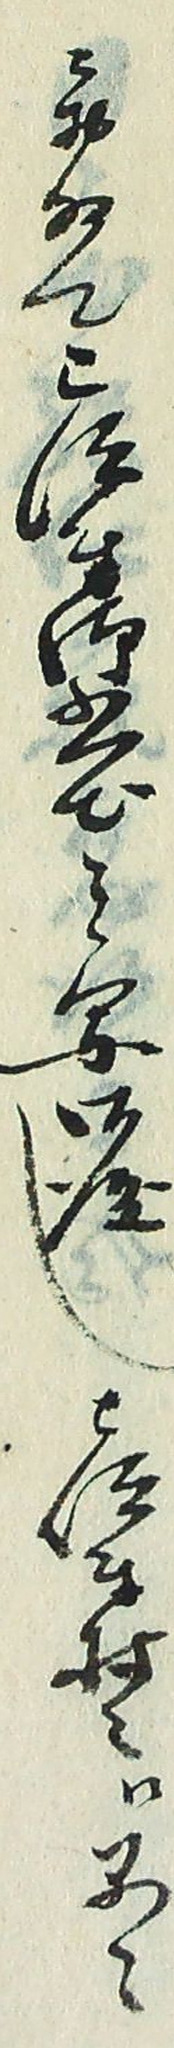ニおゐて被仰付御書出之写御座渡し被仰付村々江早々
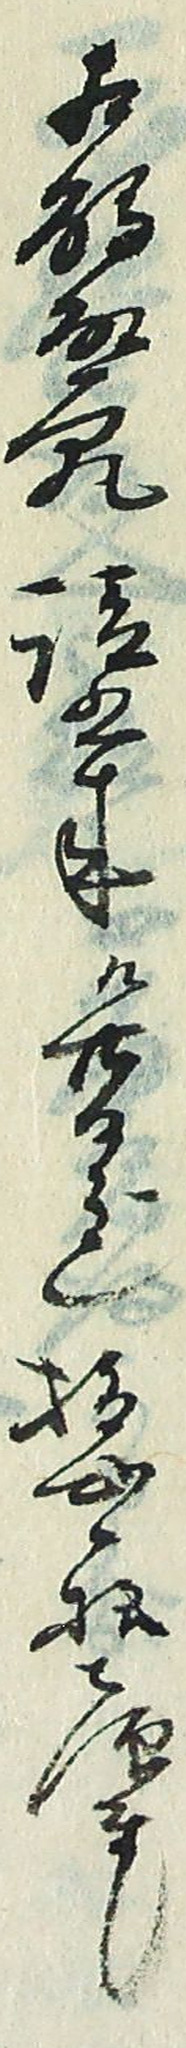相觸取究請書来ル廿日迄指出候様被仰付候
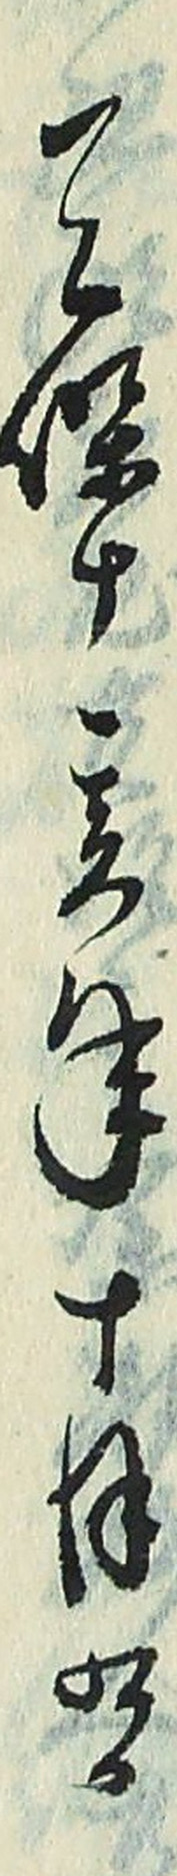天保十亥年十月九日
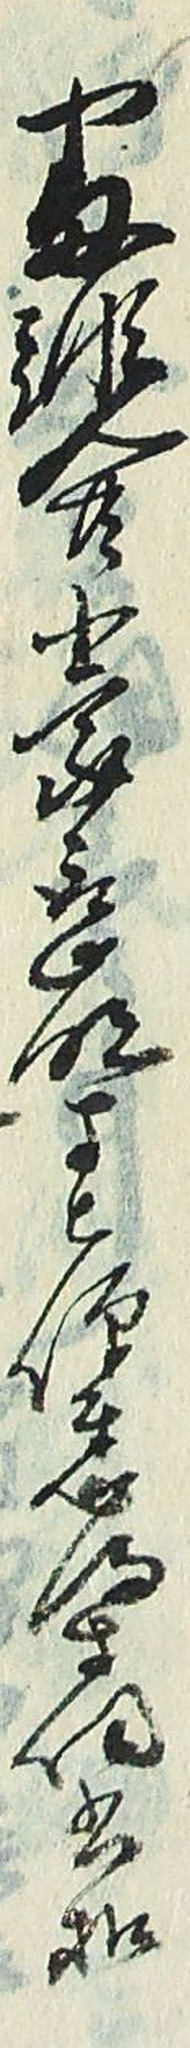○番非人共小家取崩方被仰付心得方伺書扣
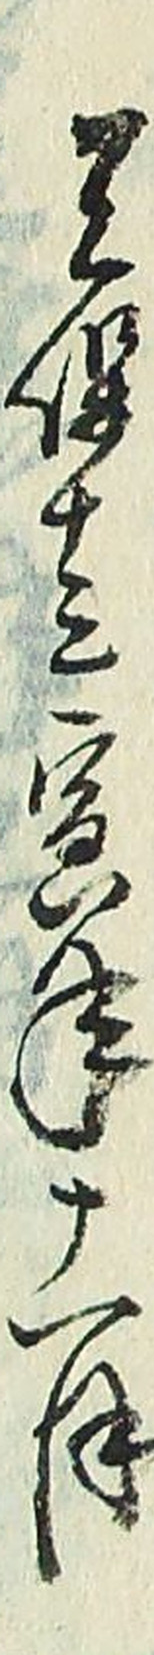天保十三寅年十一月
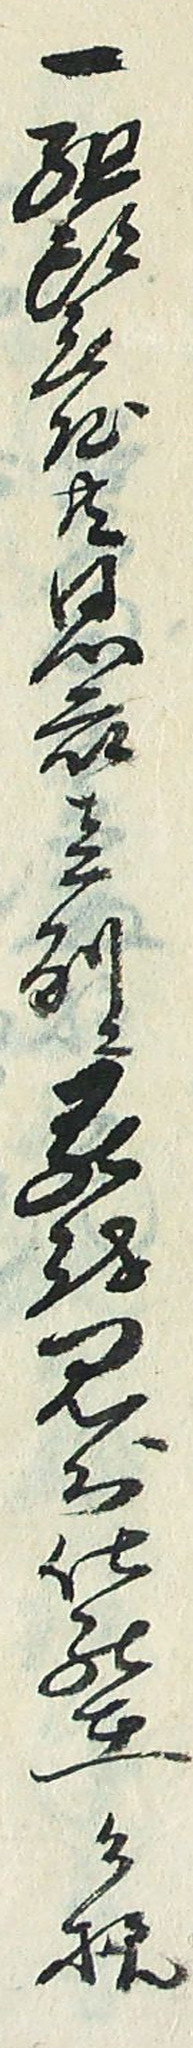一組頭庄屋共同心衆壱列ニ罷越見分仕罷在候様

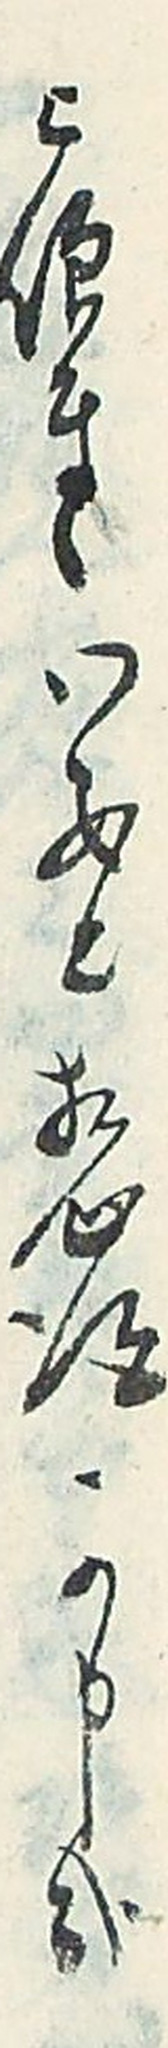被仰付候御義と相心得可申哉
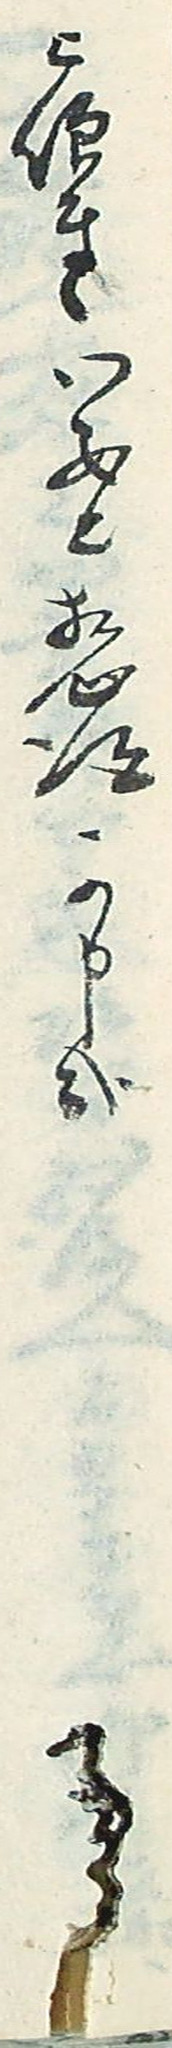被仰付候御義と相心得可申哉
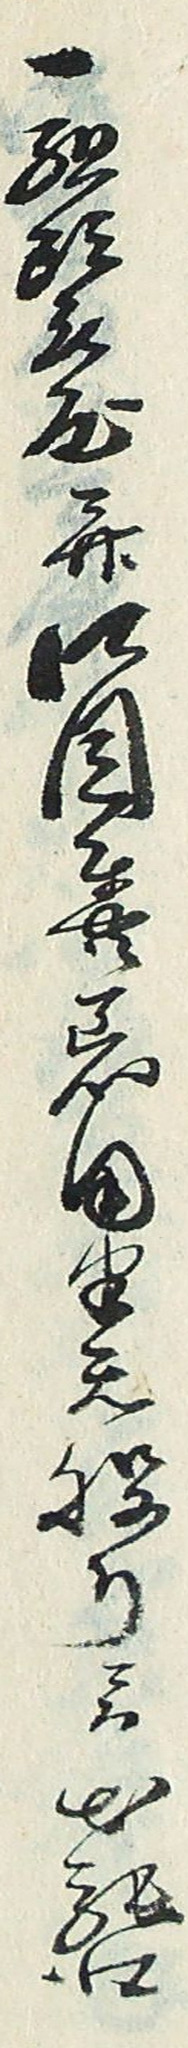一組頭庄屋幷郷目付共着用半天股引ニ而出張仕
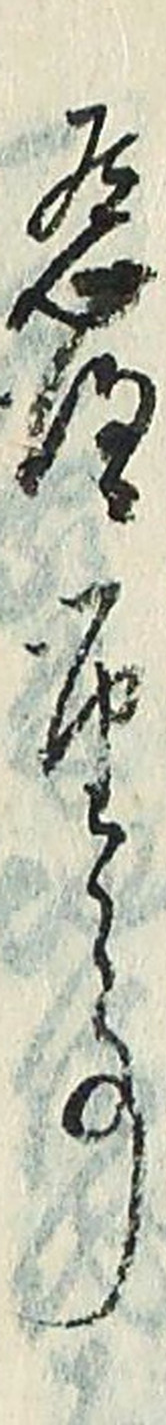居心得ニ御坐候事
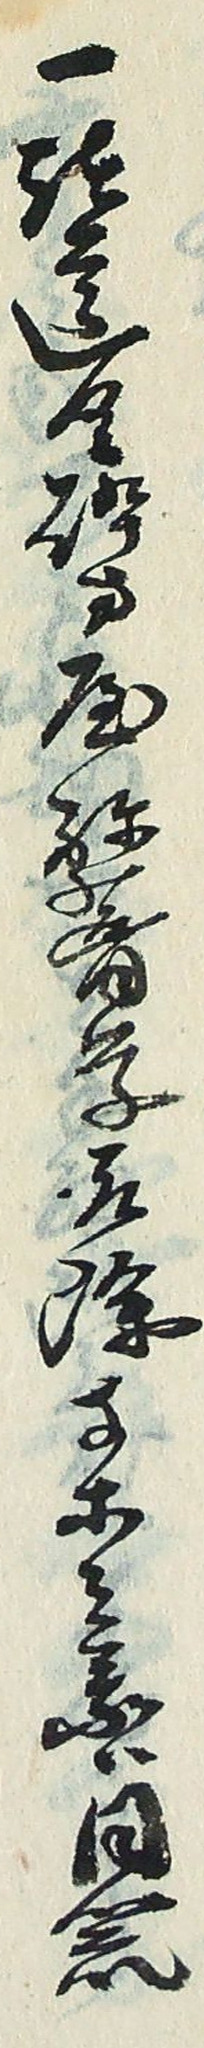一諸道具砕方屋祢葺草取除方等之義ハ同心衆
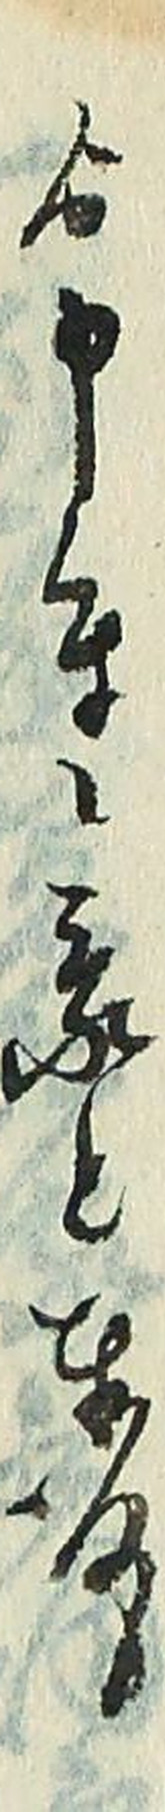ゟ申付候義と奉存候
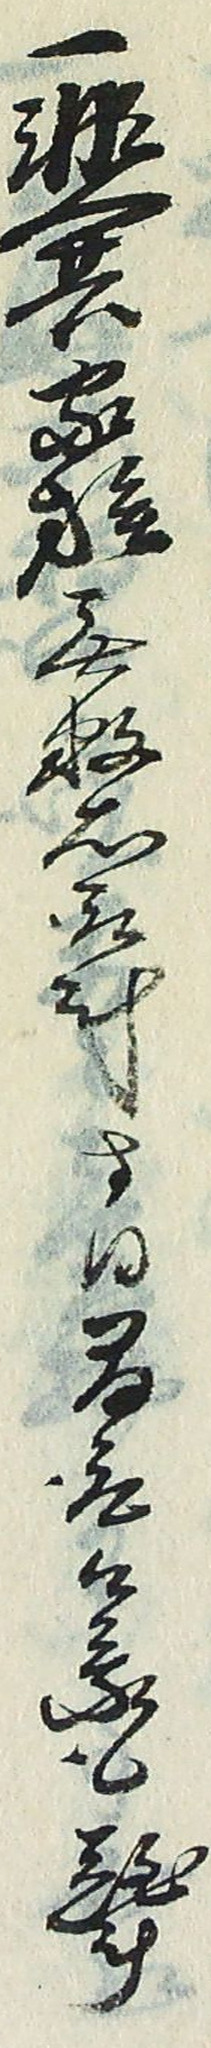一非人共家族無数右取計方手間取候義も難計
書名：諸御趣意書并御下知向之写
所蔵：鳴門教育大学 Naruto University of Education
